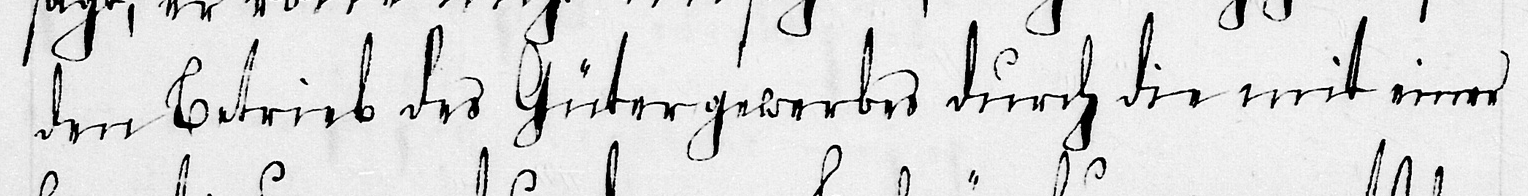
den Betrieb des Gütergewerbes durch die mit einer
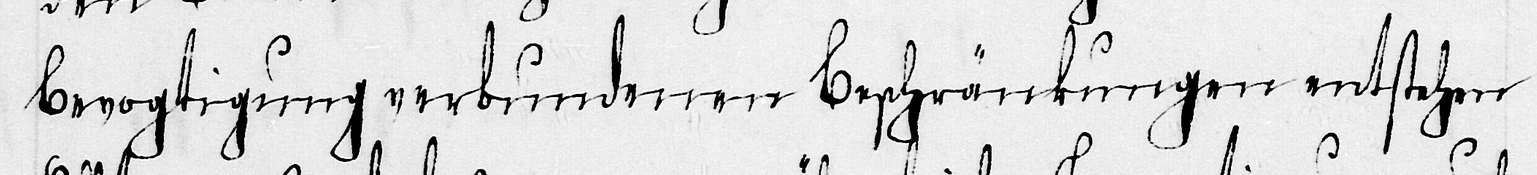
Bevogtigung verbundenen Beschränkungen entstehen
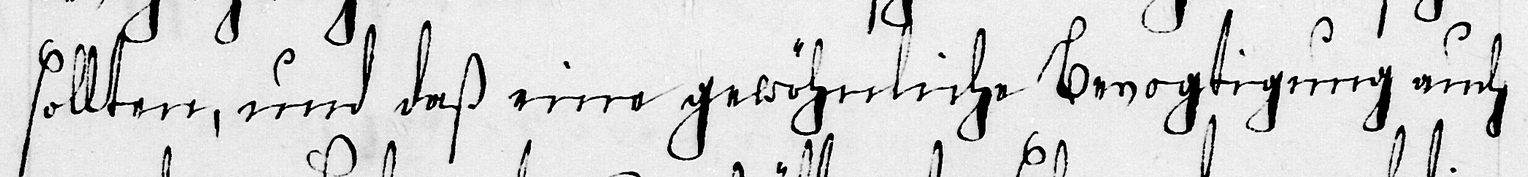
sollten, und daß eine gewöhnliche Bevogtigung auch
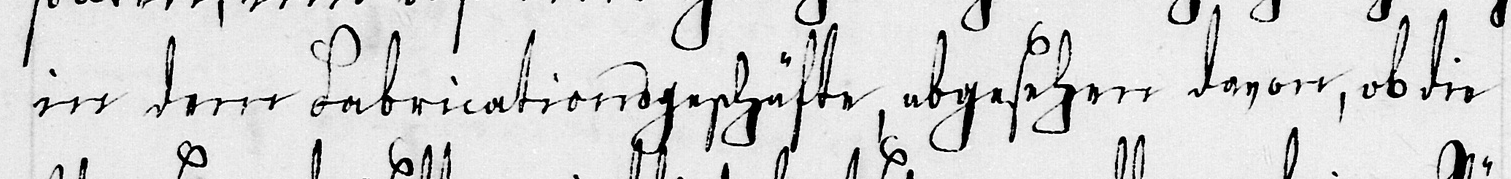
in dem Fabricationsgeschäfte, abgesehen davon, ob die
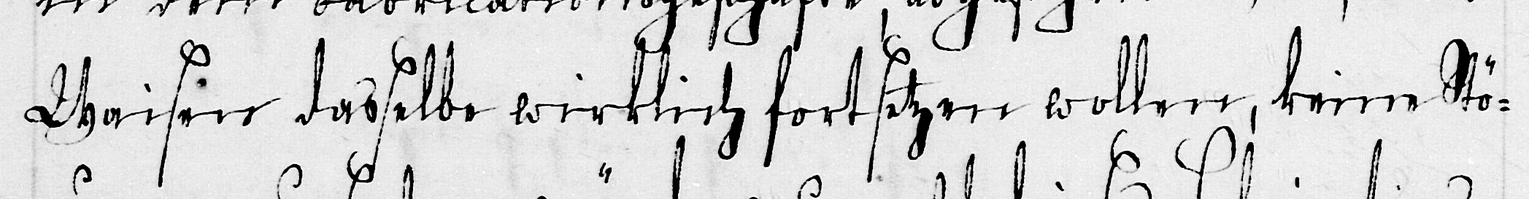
Waisen dasselbe wirklich fortsetzen wollen, keine Stö¬
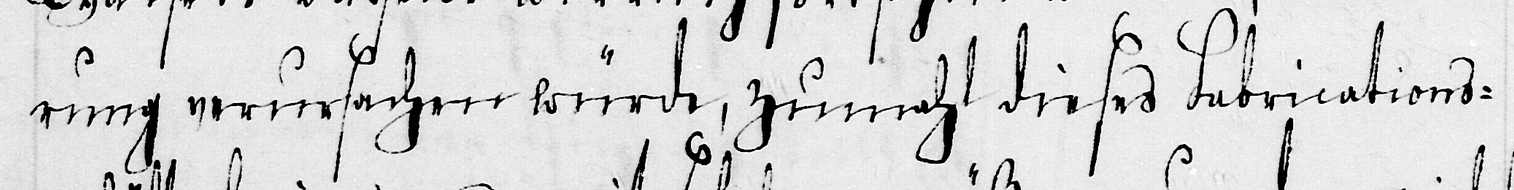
rung verursachen würde, zumahl dieses Fabrications¬
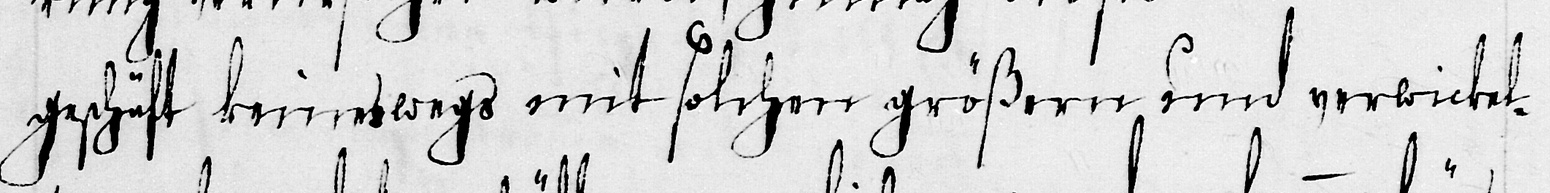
geschäft keineswegs mit solchen größern und verwickel¬
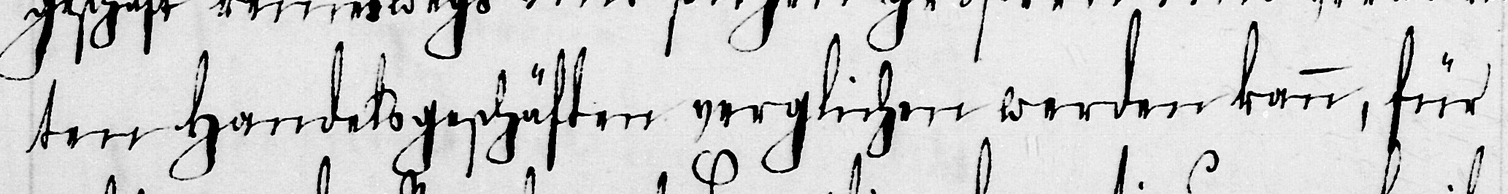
ten Handelsgeschäften verglichen werden kann, für
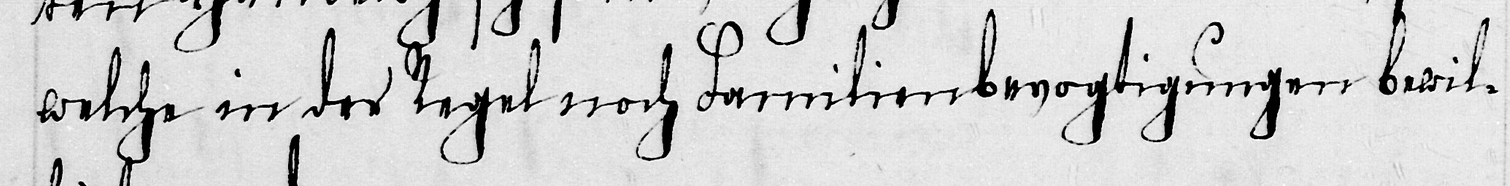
welche in der Regel noch Familienbevogtigungen bewil¬
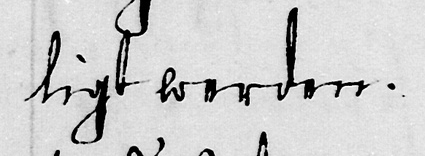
ligt werden.
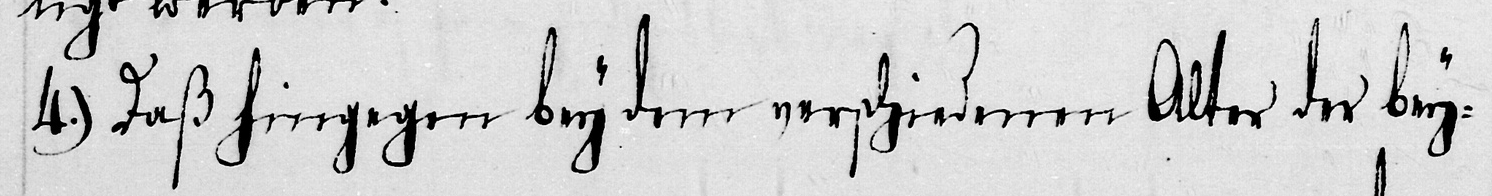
4.) Daß hingegen bey dem verschiedenen Alter der bey-
